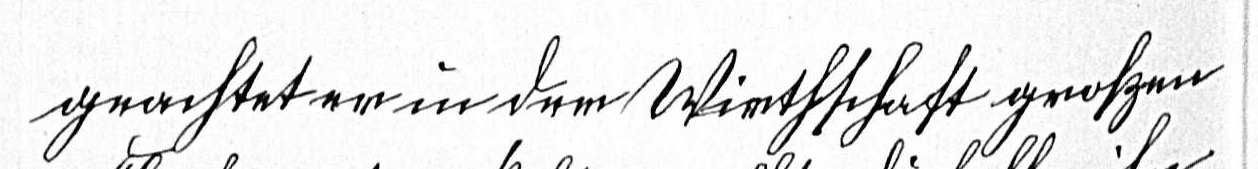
geachtet er in der Wirtschaft großen
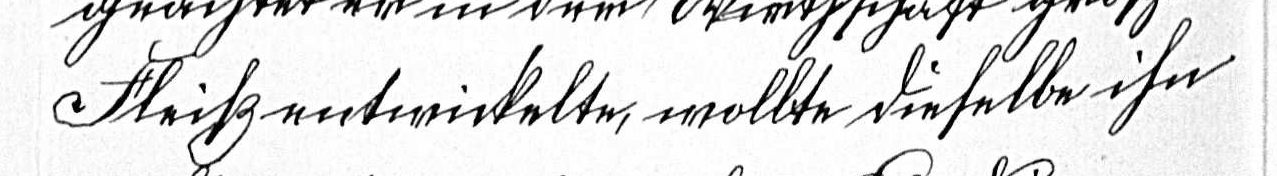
Fleiß entwickelte, wollte dieselbe ihn
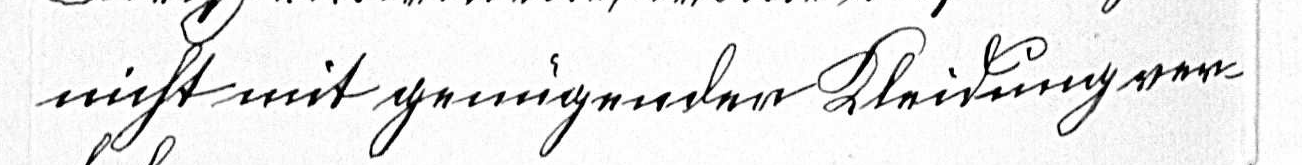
nicht mit genügender Kleidung ver¬
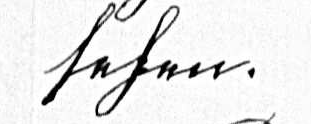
sehen.
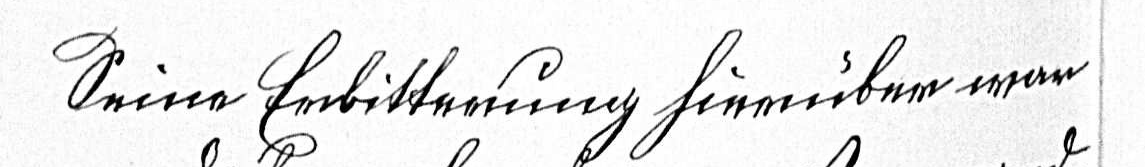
Seine Erbitterung hierüber war
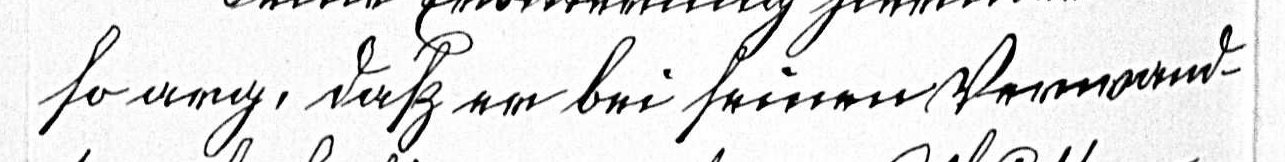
so arg, daß er bei seinen Verwand¬
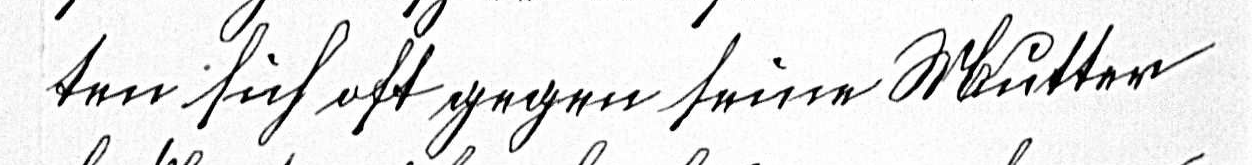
ten sich oft gegen seine Mutter
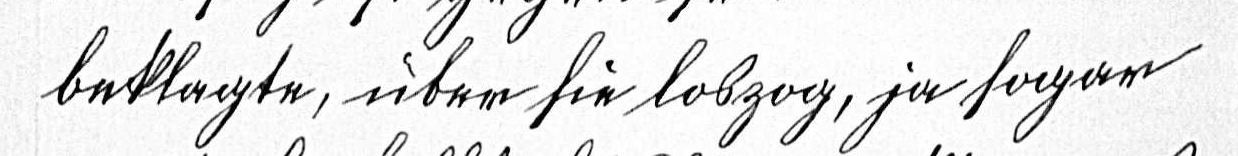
beklagte, über sie loszog, ja sogar
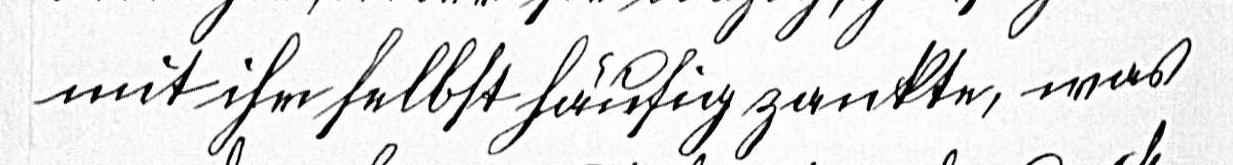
mit ihr selbst häufig zankte, was
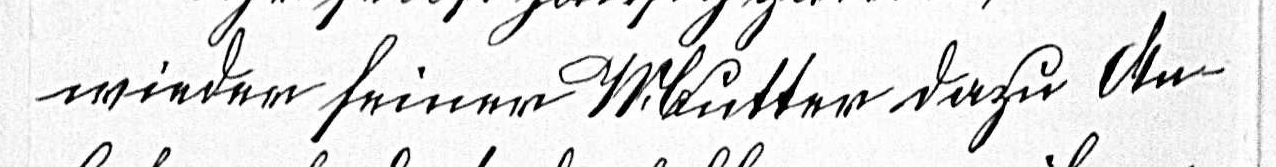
wieder seiner Mutter dazu An¬
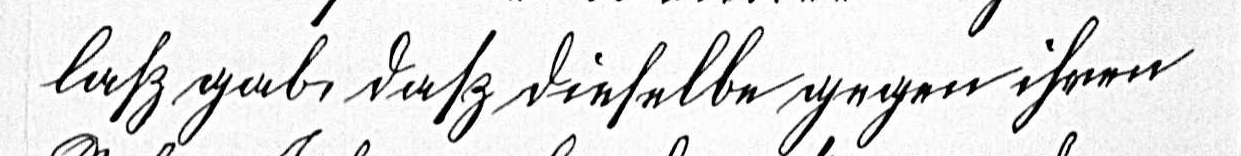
laß gab, das dieselbe gegen ihren
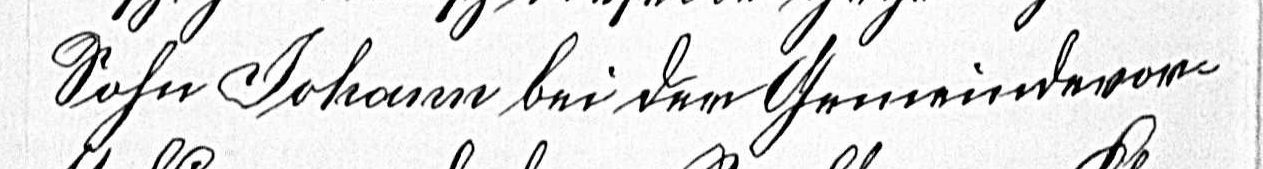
Sohn Johann bei der Gemeindevor¬
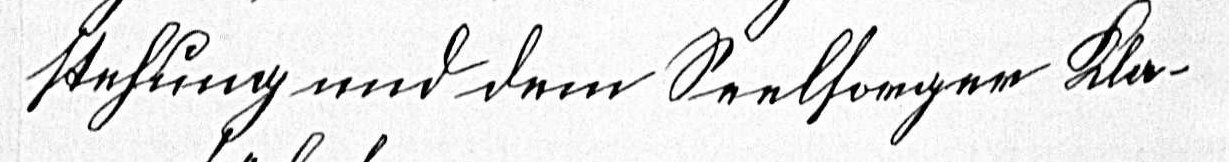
stehung und dem Seelsorger Kla¬
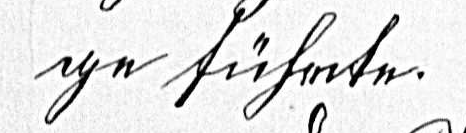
ge führte.
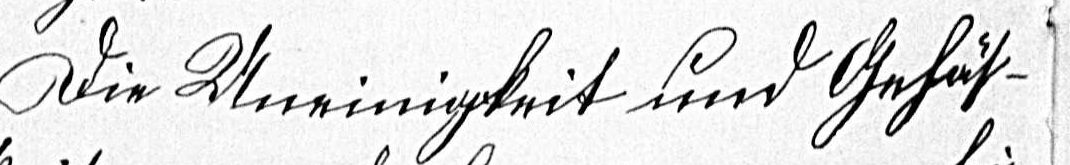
Die Uneinigkeit und Gehäs¬
